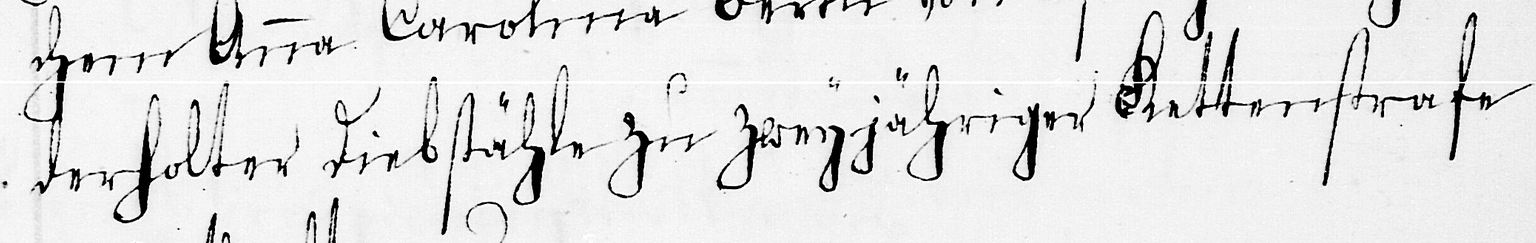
derholter Diebstähle zu zweyjähriger Kettenstrafe
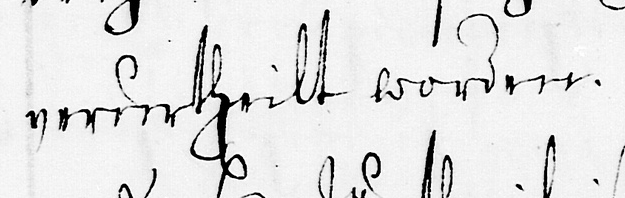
verurtheilt worden.
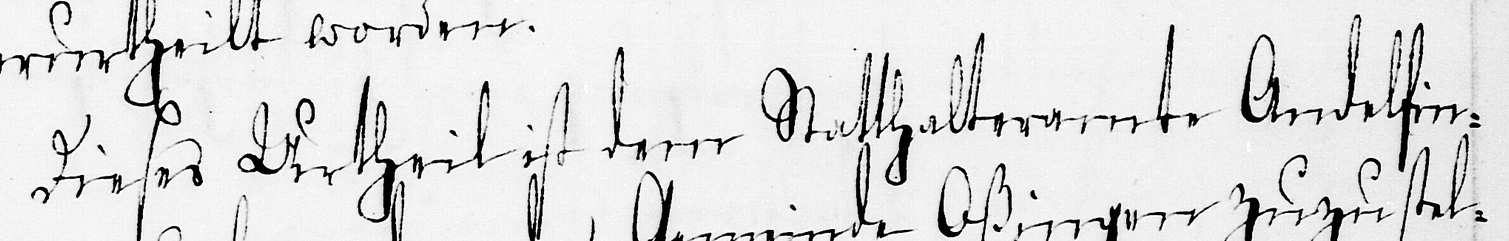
Dieses Urtheil ist dem Statthalteramte Andelfin¬
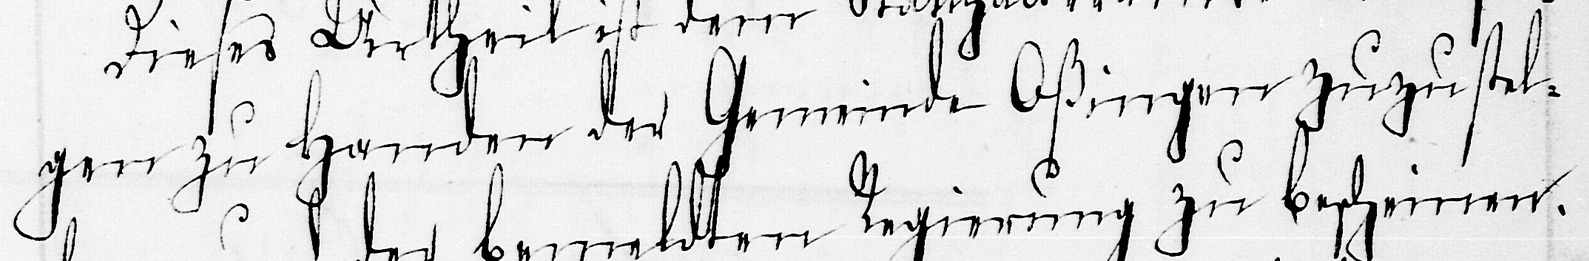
gen zu Handen der Gemeinde Oßingen zuzustel¬
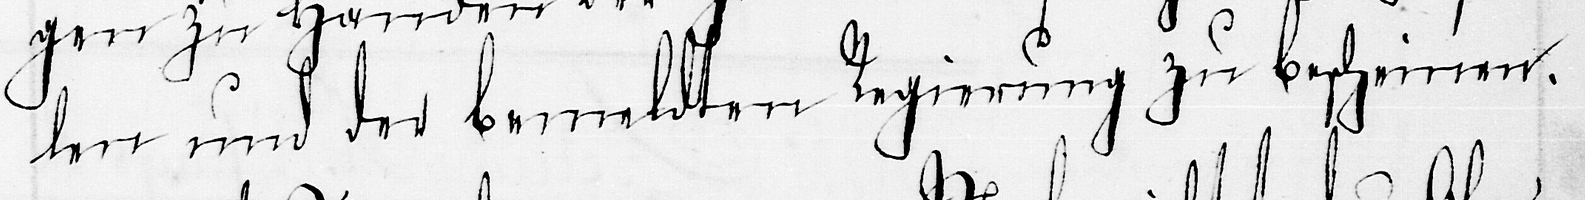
len und der bemeldten Regierung zu bescheinen.
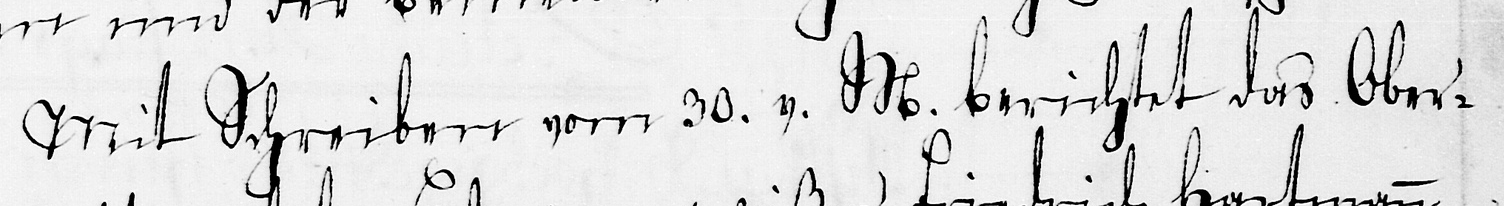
Mit Schreiben vom 30. v. M. berichtet das Ober¬
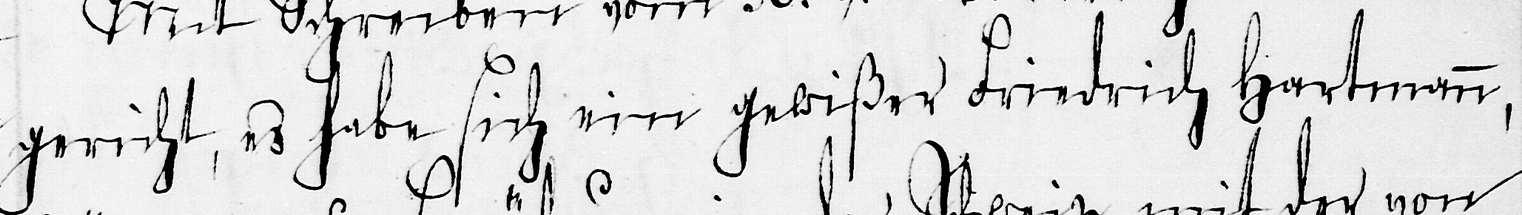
gericht, es habe sich ein gewißer Friedrich Hartmann,
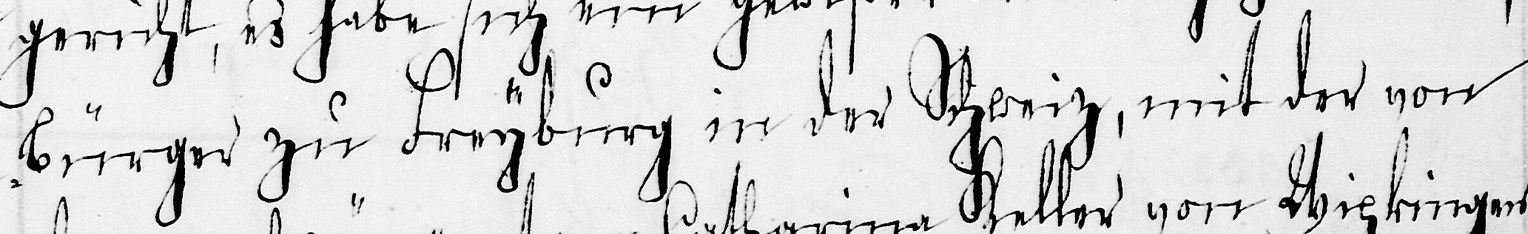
Bürger zu Freyburg in der Schweiz, mit der von
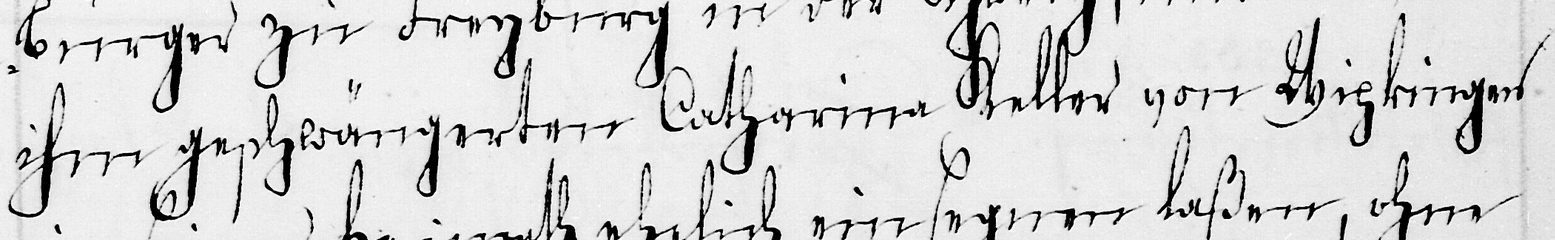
ihm geschwängerten Catharina Keller von Wipkingen
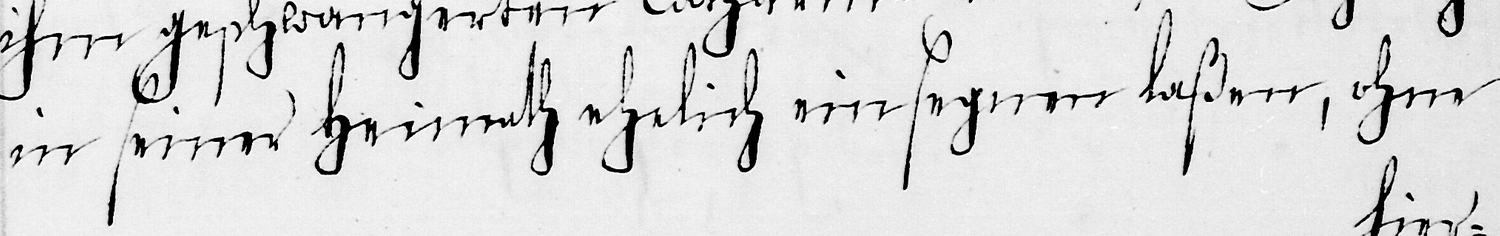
in seiner Heimath ehelich einsegnen laßen, ohne
